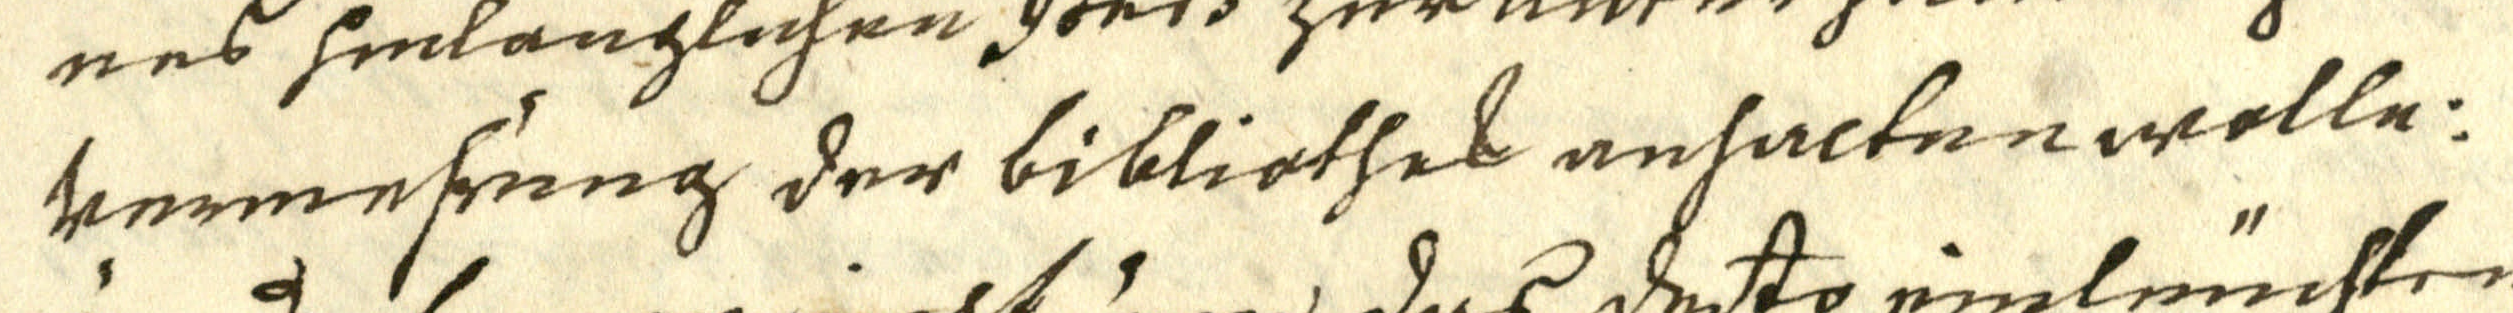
Vermehrung der Bibliothek anhalten wolle:
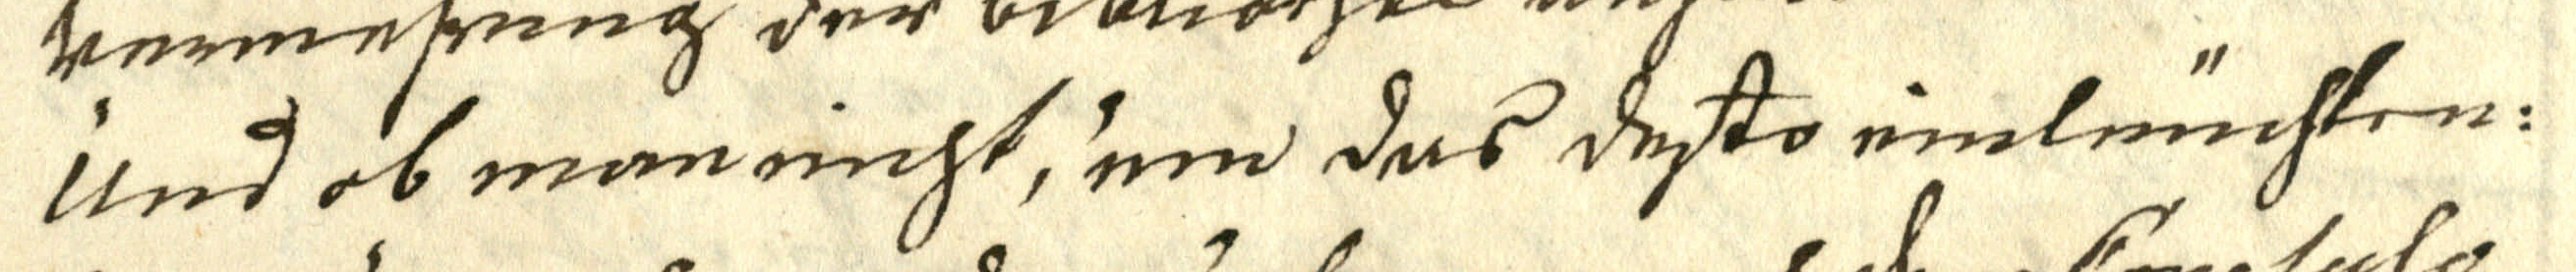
Und ob man nicht, um das desto einleuchten¬
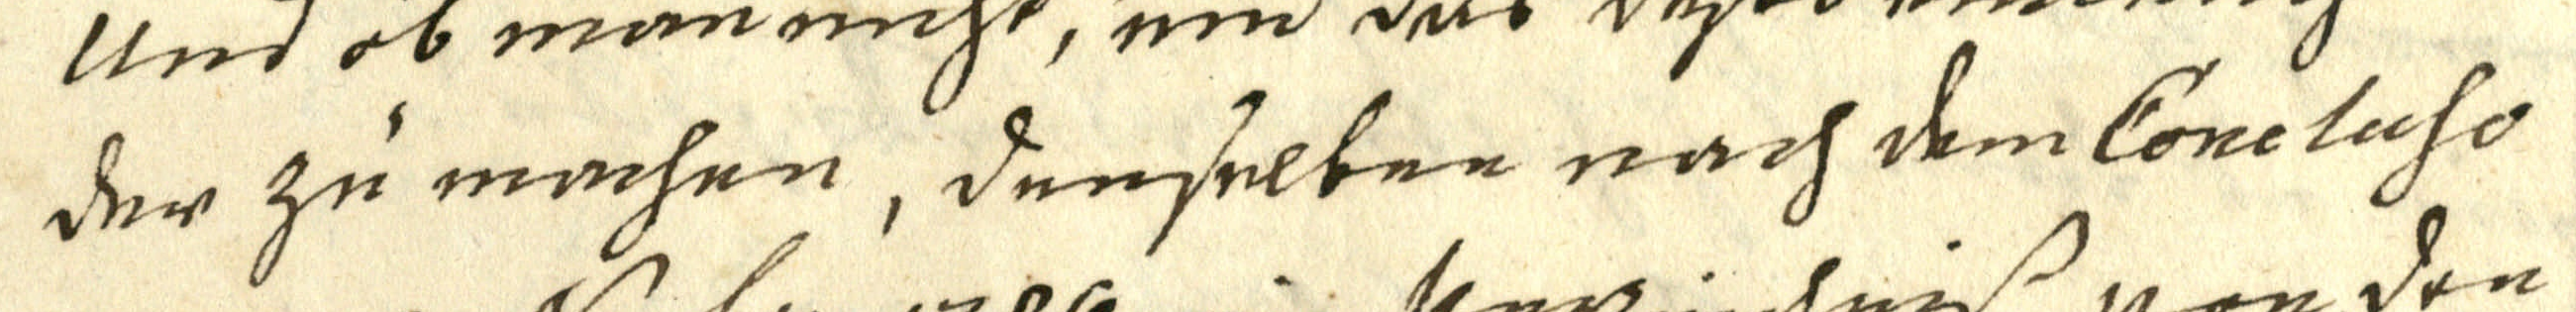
der zu machen, denselben nach dem Concluso
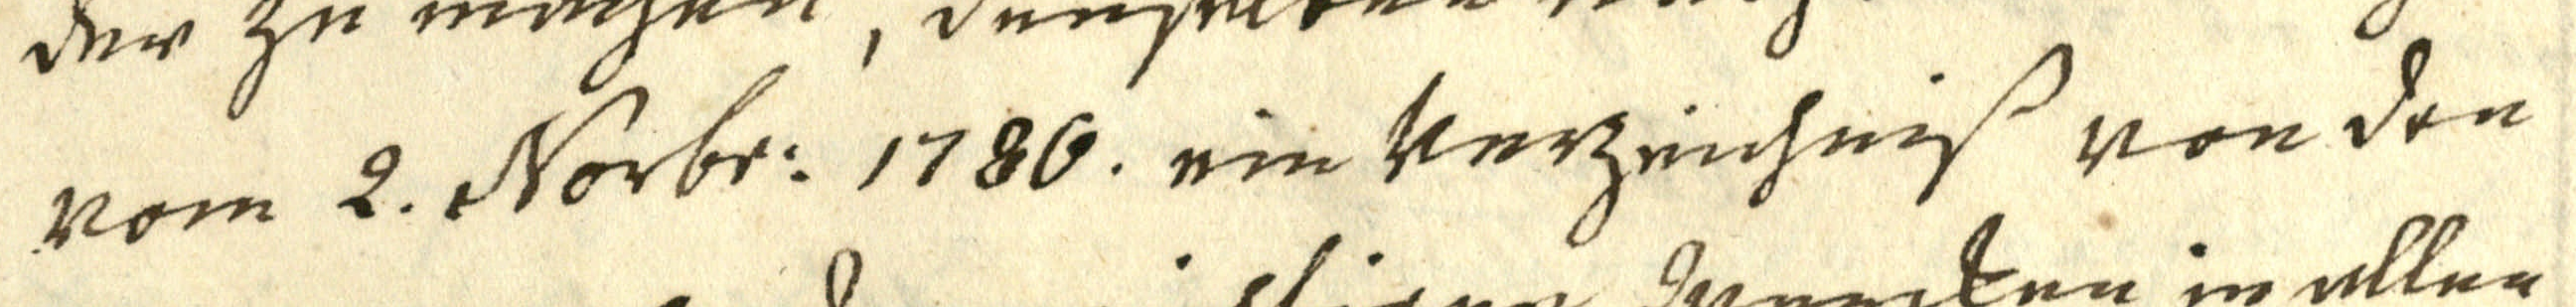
vom 2. Novbr. 17 80. ein Verzeichniß von den
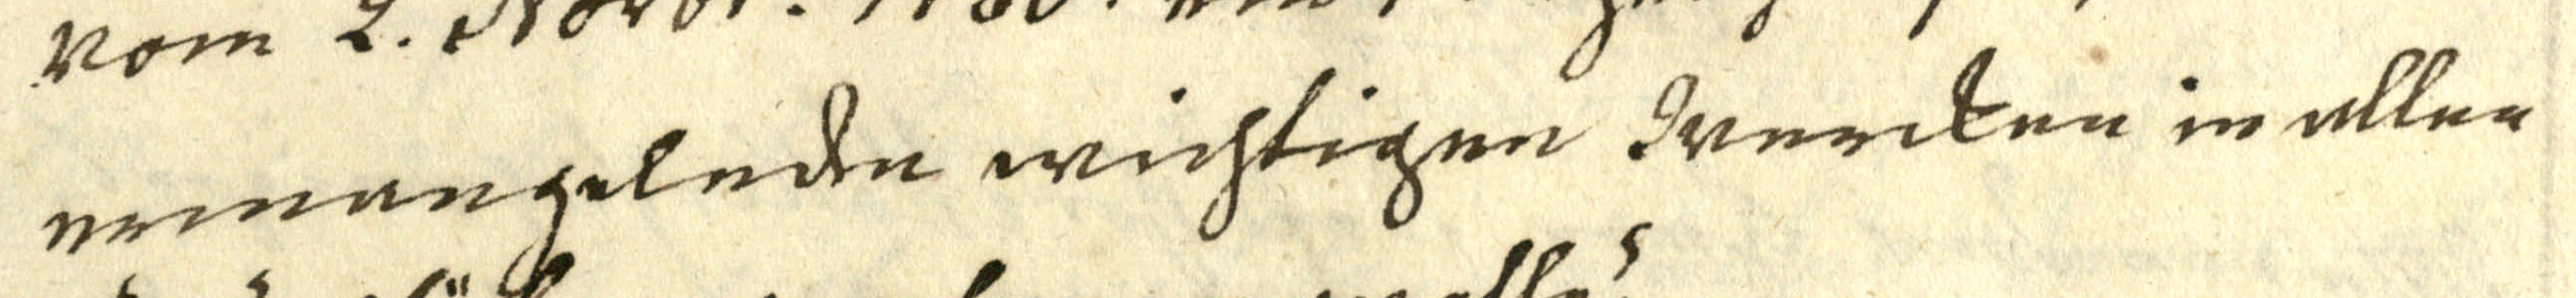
ermangelnden wichtigen Wercken in allen
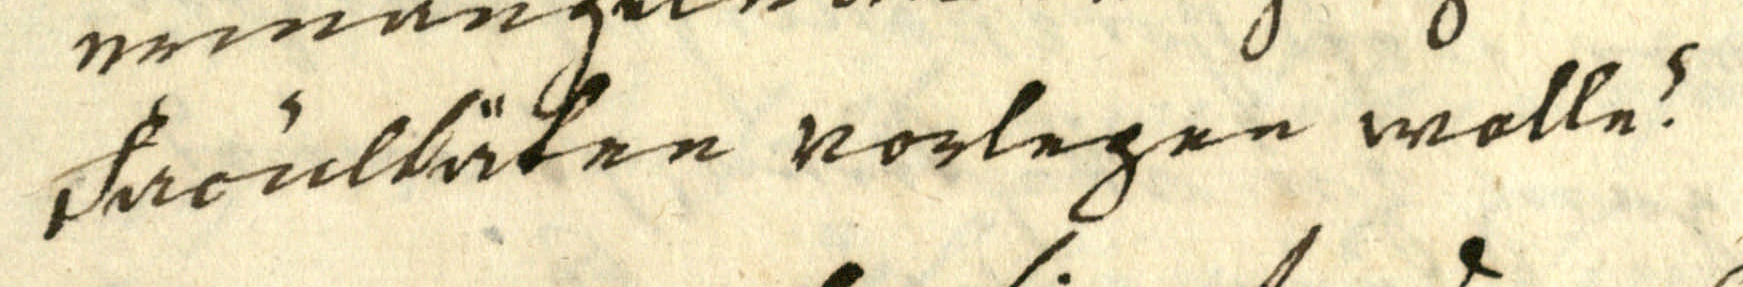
Facultäten vorlegen wolle?
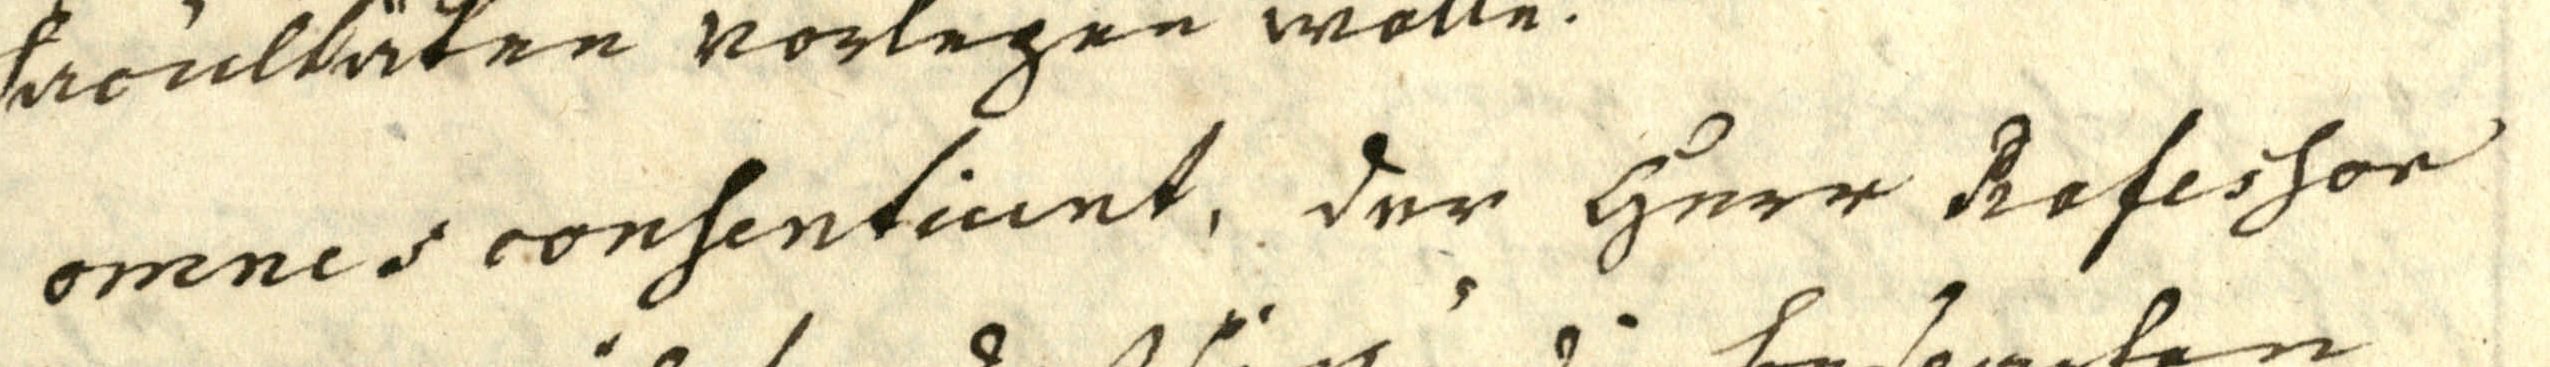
omnes consentiunt, der Herr Professor
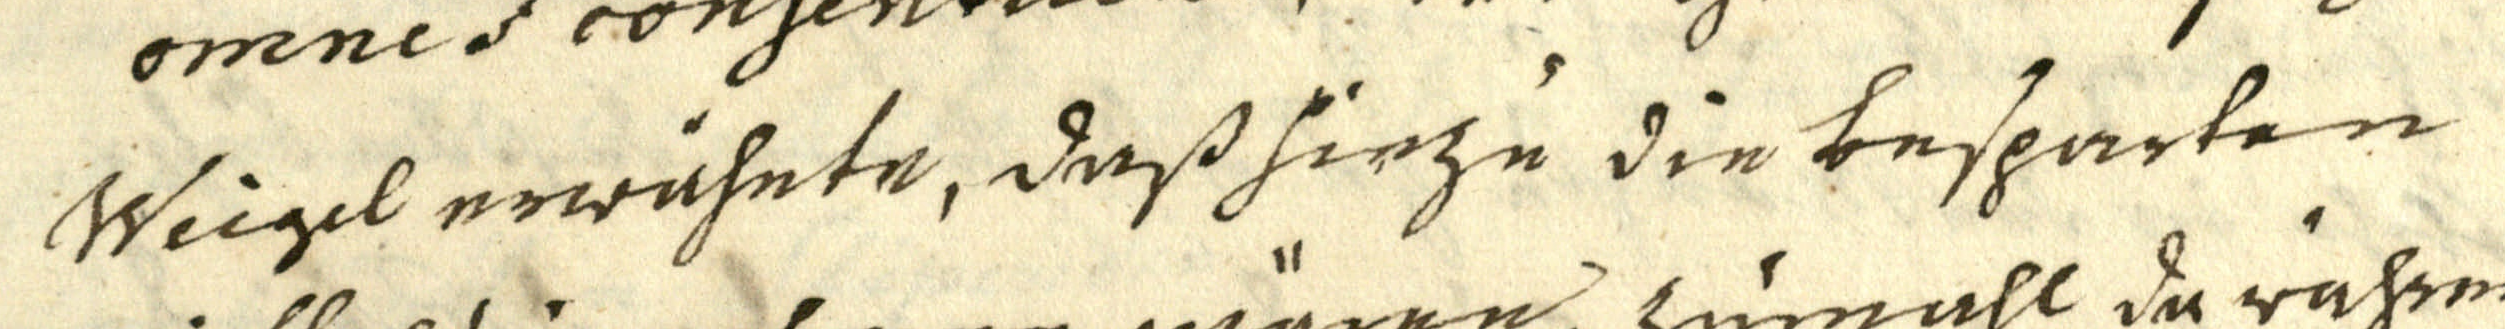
Weigel erwähnte, daß hiezu die besparten
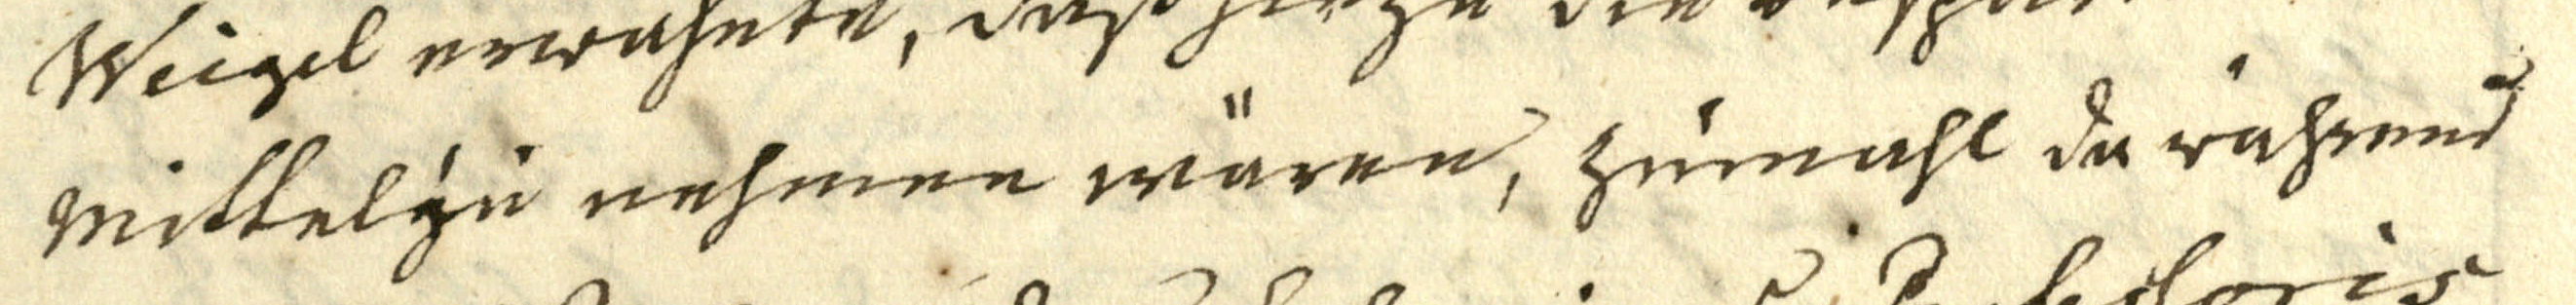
Mittel zu nehmen wären, zumahl da während
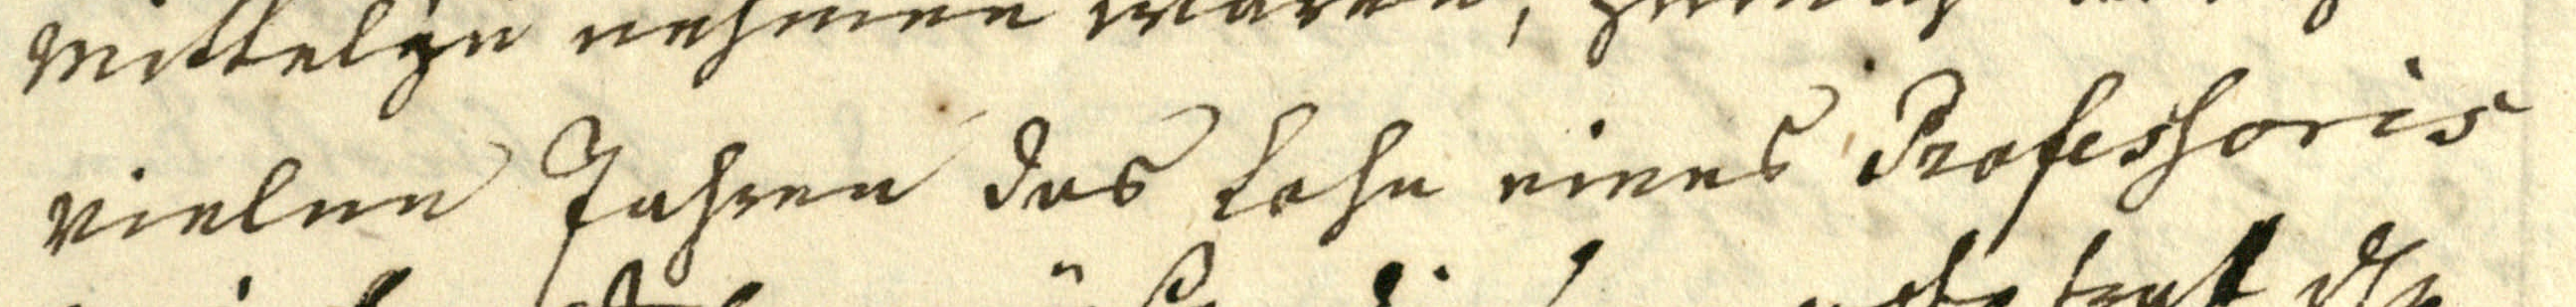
vielen Jahren das Lohn eines Professoris
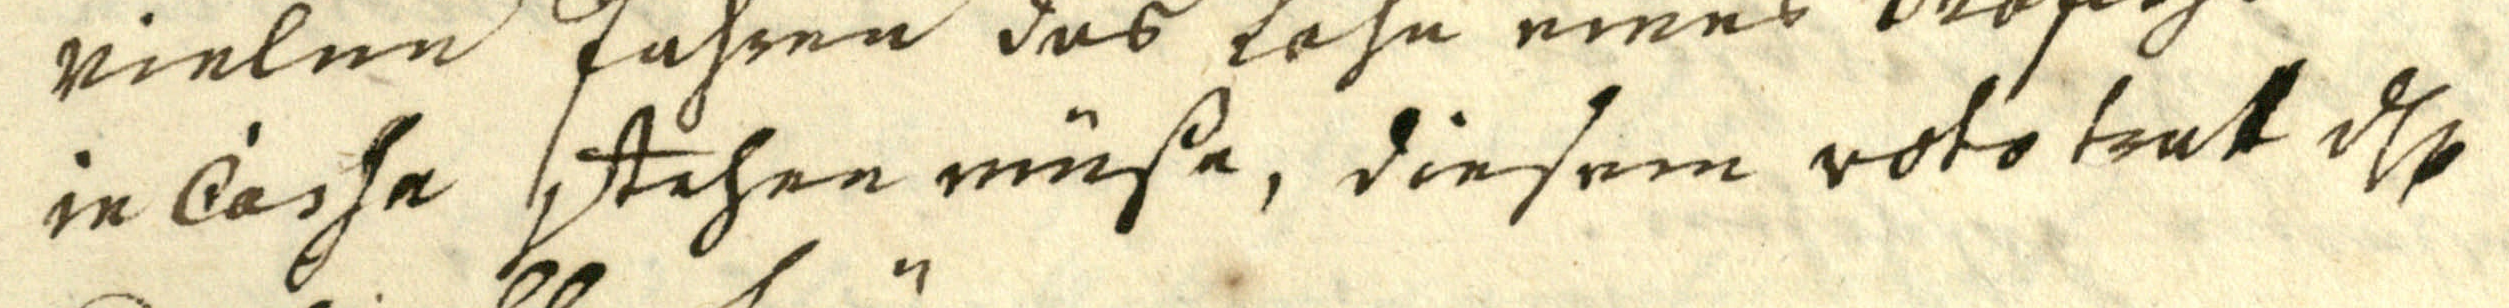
in Cassa stehen müße, diesem voto trat dh
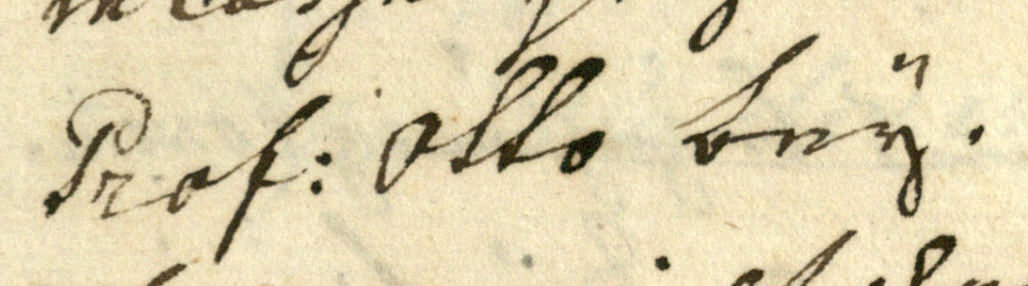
Prof. Otto beÿ.
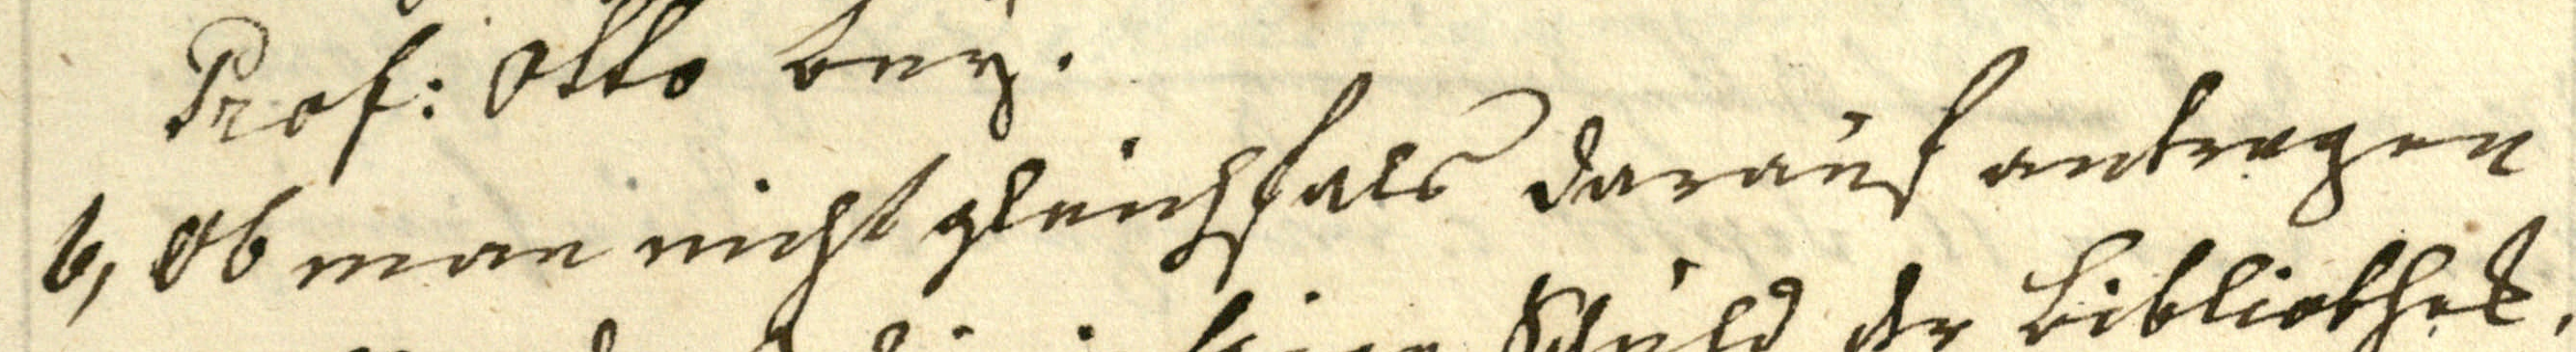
b, Ob man nicht gleichfals darauf antragen
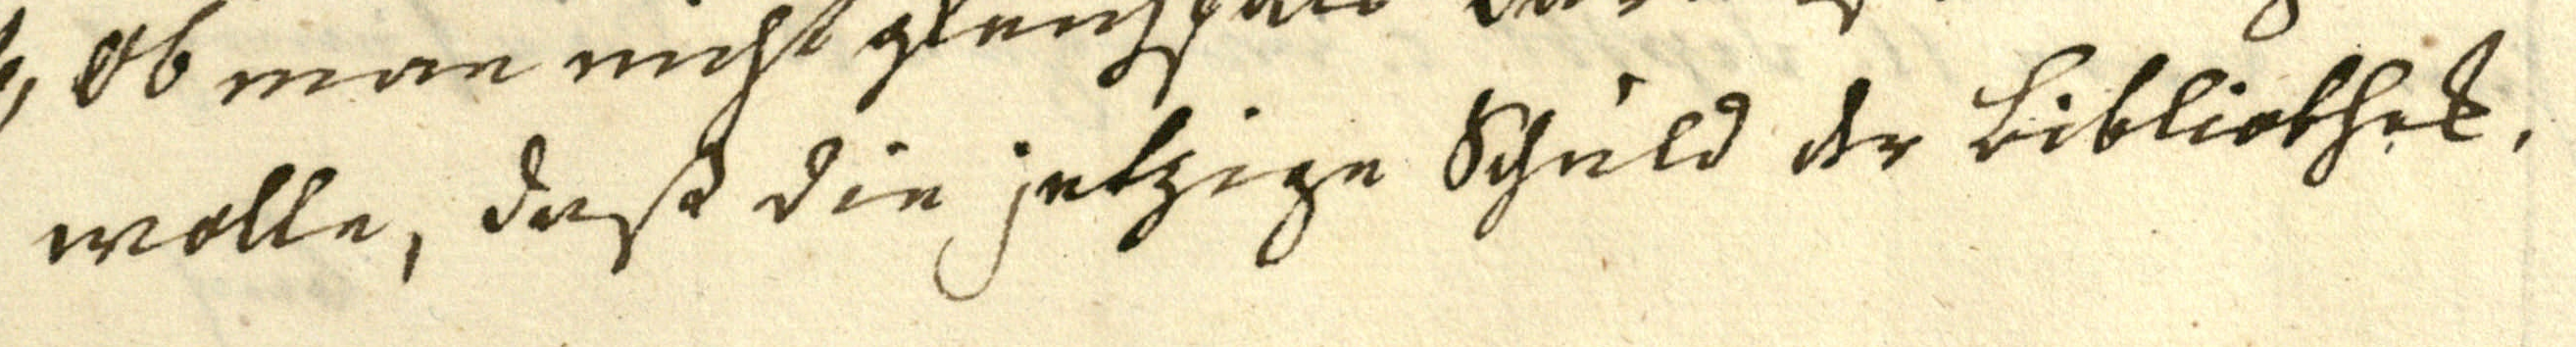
wolle, daß die jetzige Schuld der Bibliothek,
